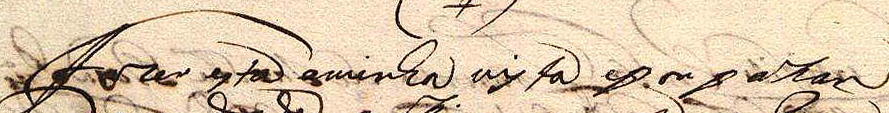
Fazer esta a minha uista e por passar
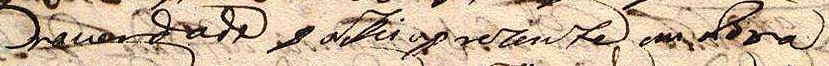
na uerdade e assi a prezente em Bra
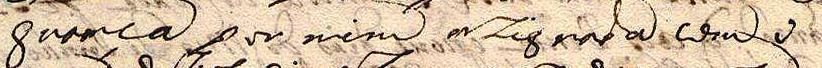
guança por mim asignada com o
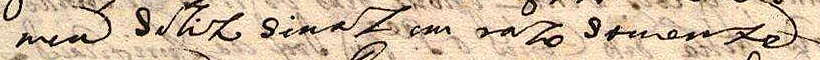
meu delito sinaL em razo e temente
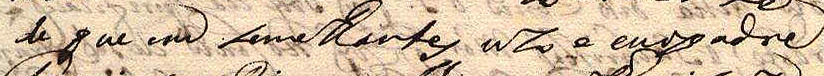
de que em semelhantes uzo e eu o padre
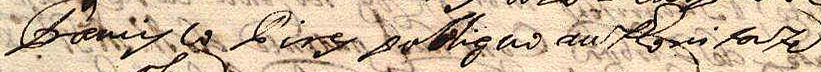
Francisco Pires publiquo authoritate
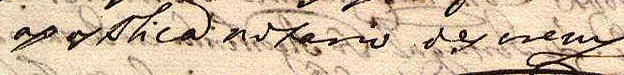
apostolica notario o escreuy
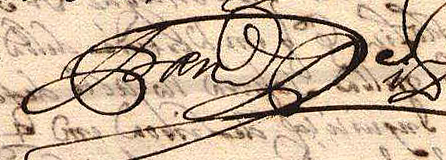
Franco Piz̄
